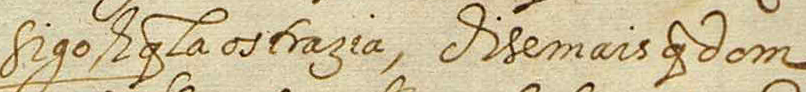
Sigo, E q̄ la os trazia, dise mais q̄ dom
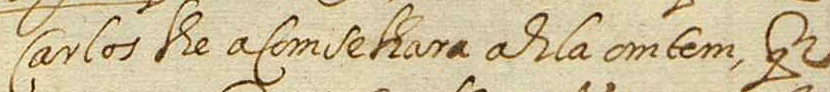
Carlos lhe aComselhara a Ela omtem, q̄
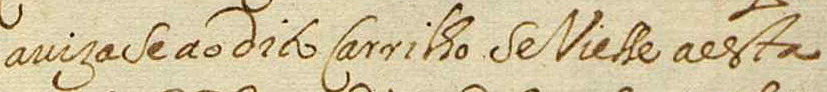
auizaSe ao dito Carrilho Se Viesse a esta
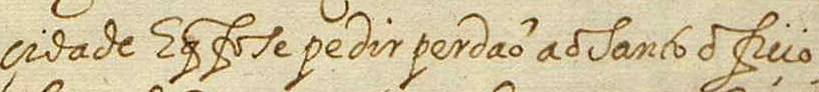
cidade E q̄ fose pedir perdaõ ao Santo oficio
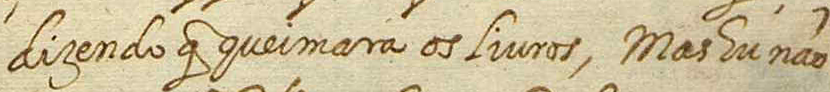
dizendo q̄ queimara os liuros, mas Eu não
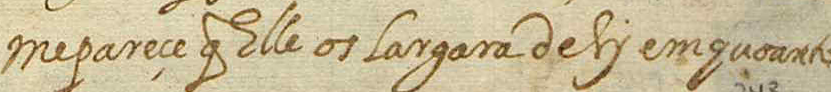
me parece q̄ Elle os largara de sy emquoanto
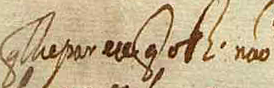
q̄ lhe parece q̄ o R. naõ
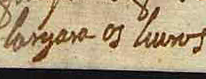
largara os liuros
